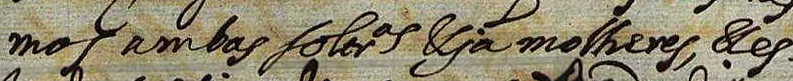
mos ambas soltras & ja molheres, & es
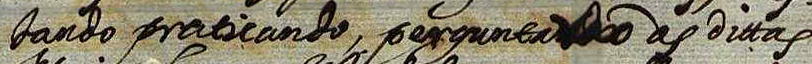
tando praticando, perguntaraõ as dittas
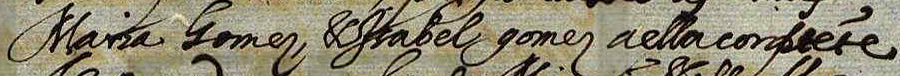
Maria Gomez, & Jsabel gomez a ella confitēte
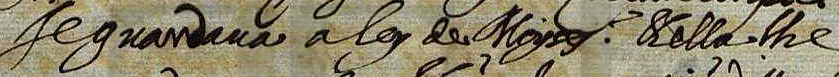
se guardaua a ley de Moyses? & ella lhe
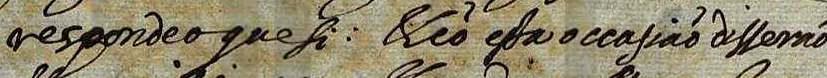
respondeo que si: & cō esta occasiaõ disseraõ
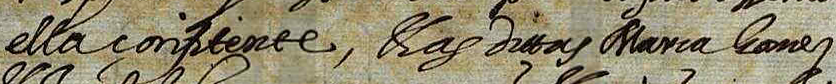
ella confitente, & as dittas Maria Gomez
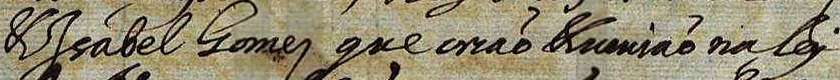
& Jsabel Gomez que criaõ & uiuiaõ na ley
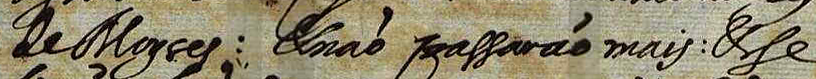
de Moyses: & naõ passaraõ mais: & se
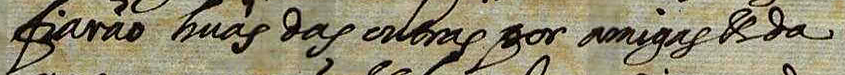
fiarão huās das outras por amigas & da
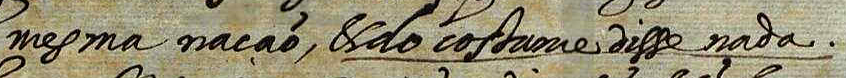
mesma naçaõ, & do costume disse nada.
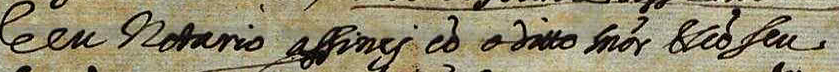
E eu Notario assinej cō o ditto snōr & cō seu
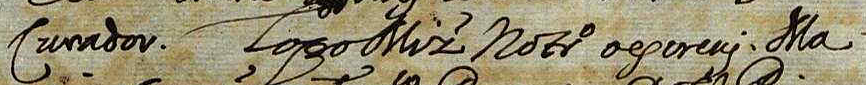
Curador. Lopo Miz̄ Notro o escreuj. Ma
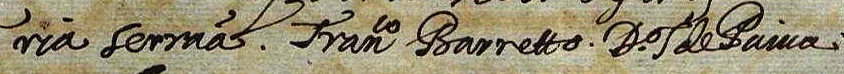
ria Serraā. Franco Barretto. D.os de Paiua.
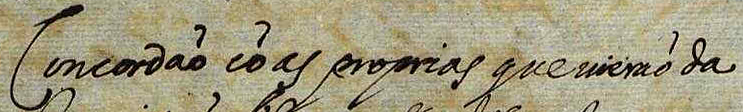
Concordaõ cō as proprias que uieraõ da
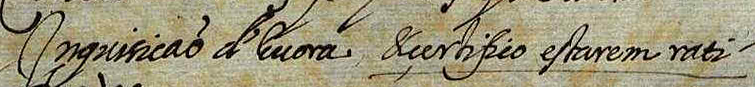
Jnquisiçaõ d'Euora & certifico estarem rati
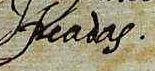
ficadas.
